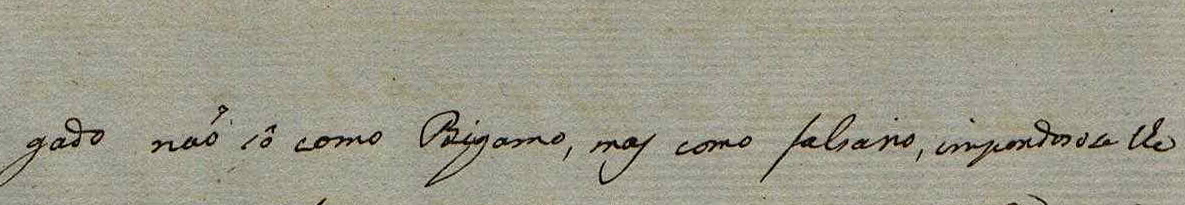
gado naõ só como Bigamo, mas como falsario, impondose se lhe
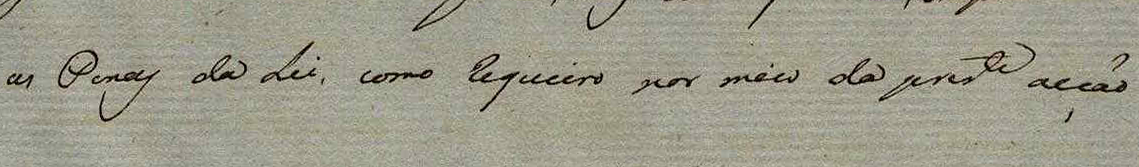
as Penas da Lei, como Requeiro por meio da preste acçaõ
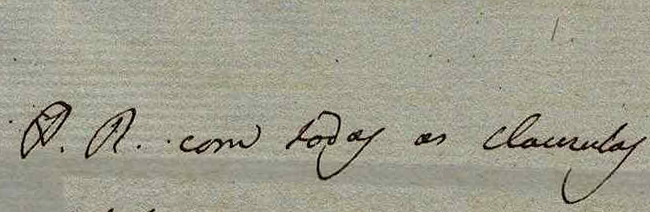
P. R. com todas as Clauzulas
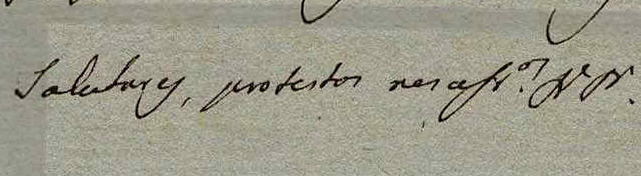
Salutares, protestos nas afr.os V V.
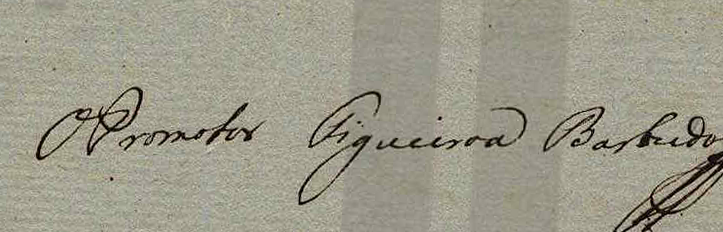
O Promotor Figueiroa Barbudo
